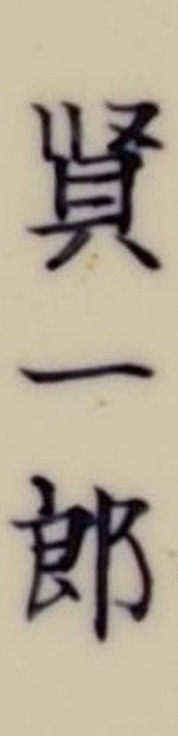賢一郎
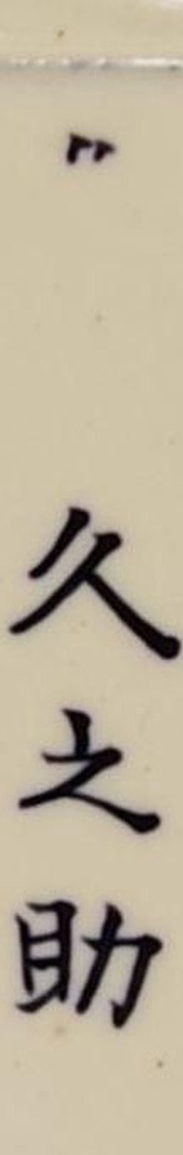久之助
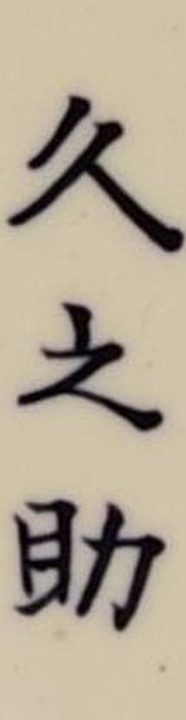久之助
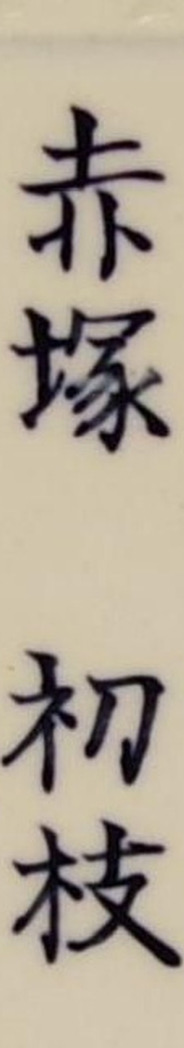赤塚初枝
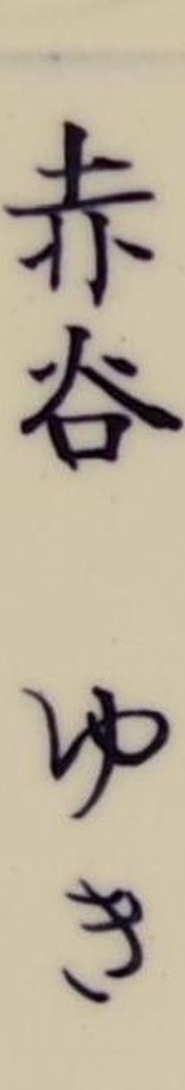赤谷ゆき
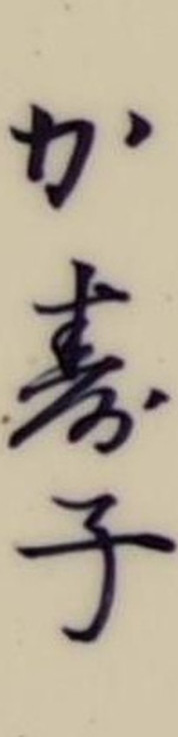かす子
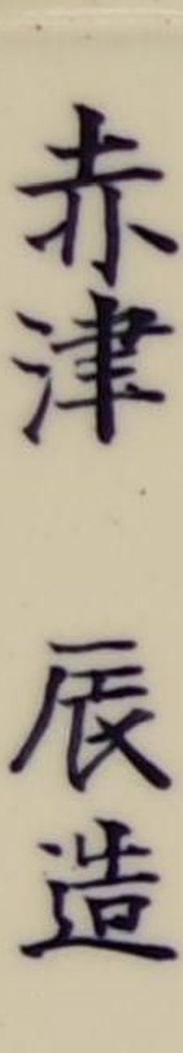赤津辰造
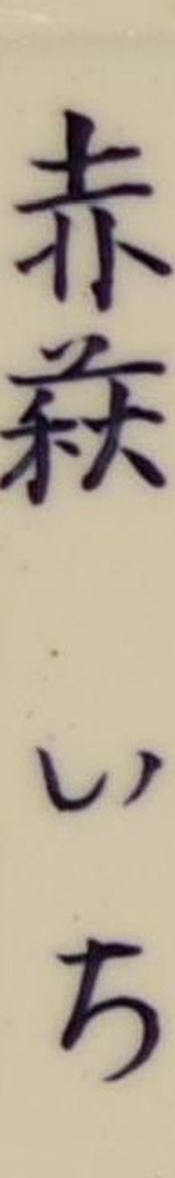赤萩いち
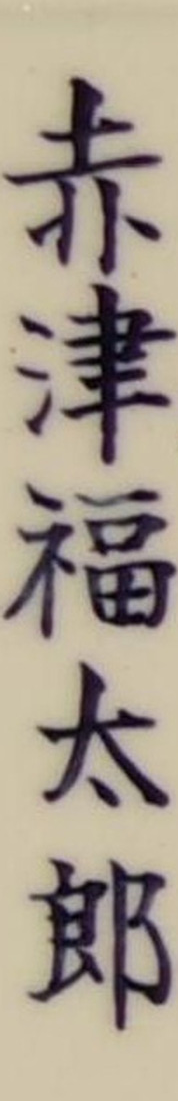赤津福太郎
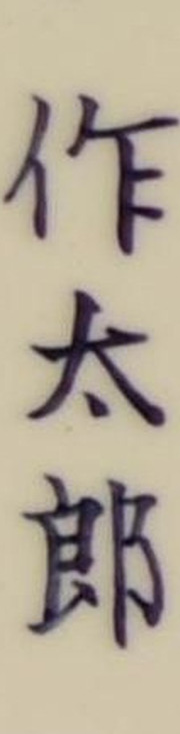作太郎
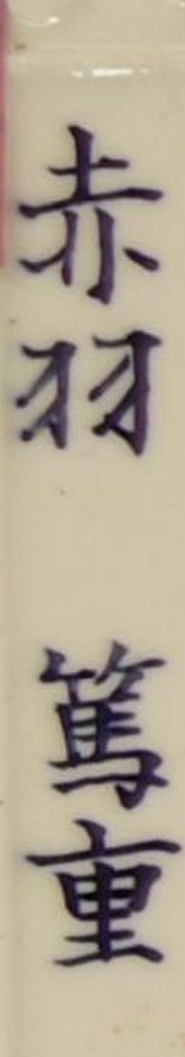赤羽篤重

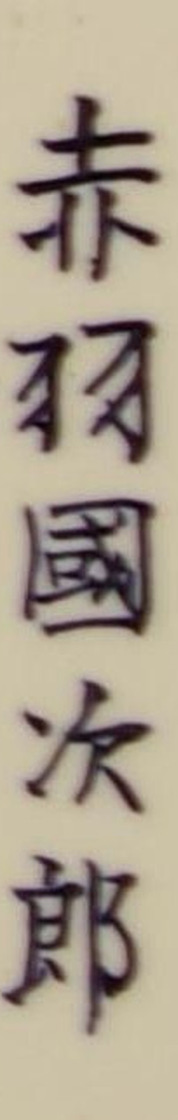赤羽国次郎
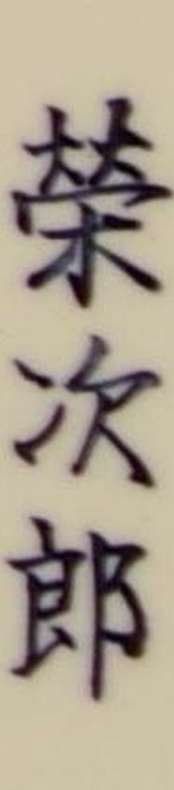榮次郎
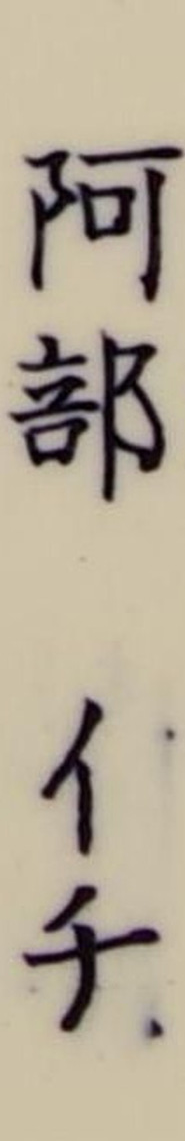阿部イチ
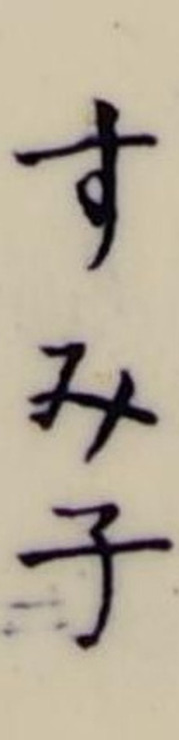すみ子
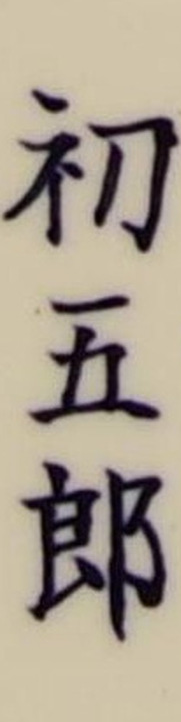初五郎
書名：E~L
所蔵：高野山金剛峯寺
